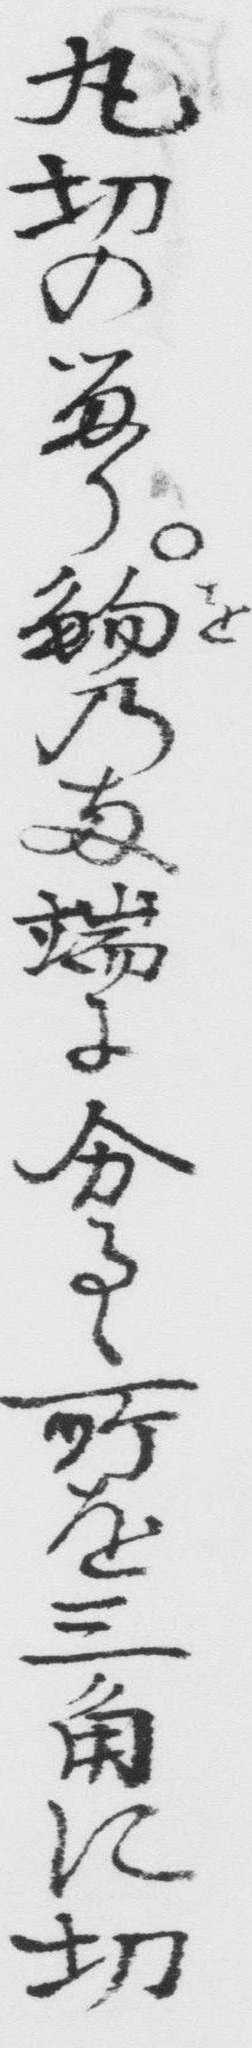三合丸切の殿り。魩の両端に分るゝ所を三角に切
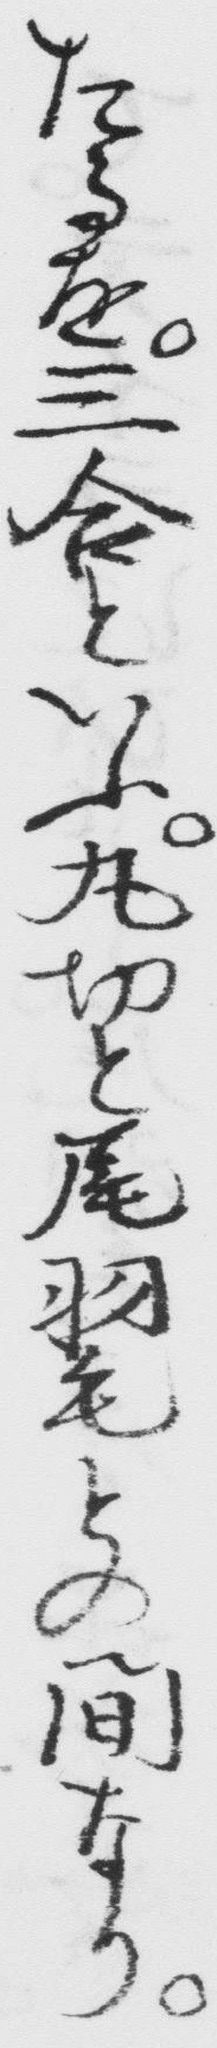たるを。三合といふ。丸切と尾羽毛との間なり。
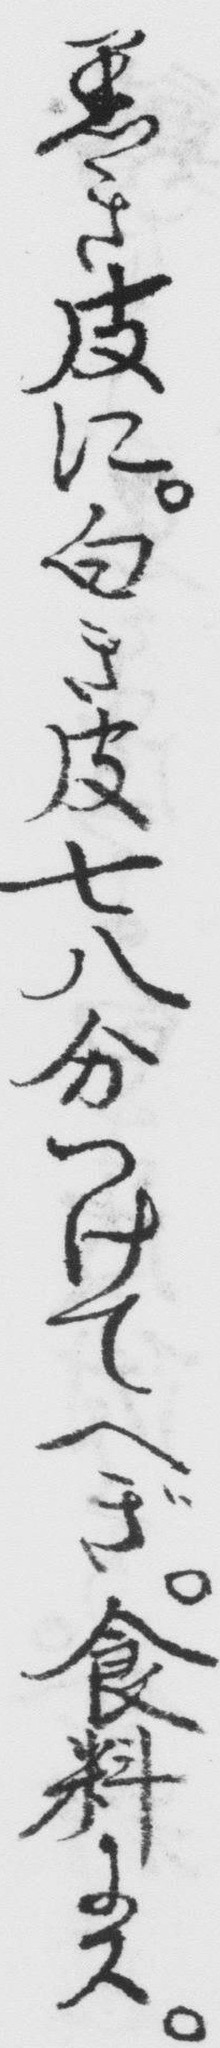黒き皮に。白き皮七八分つけてへぎ。食料にス。
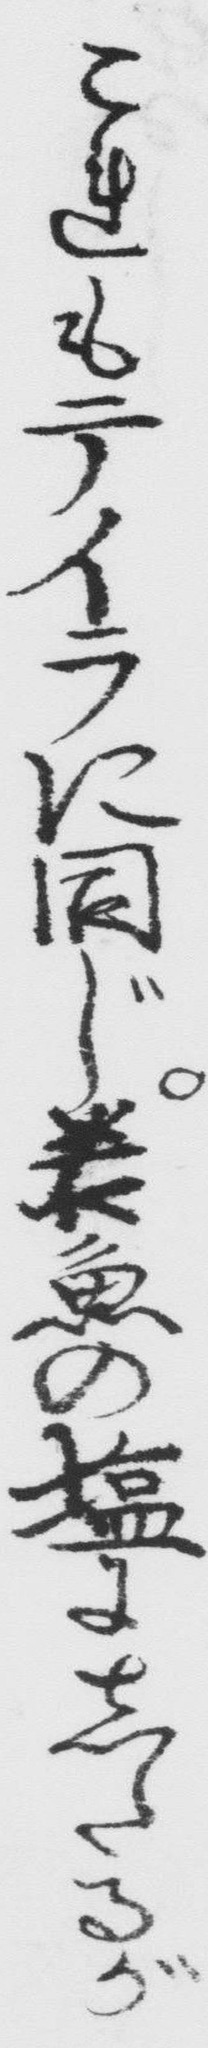これもテイラに同じ。若魚の塩にしたるが
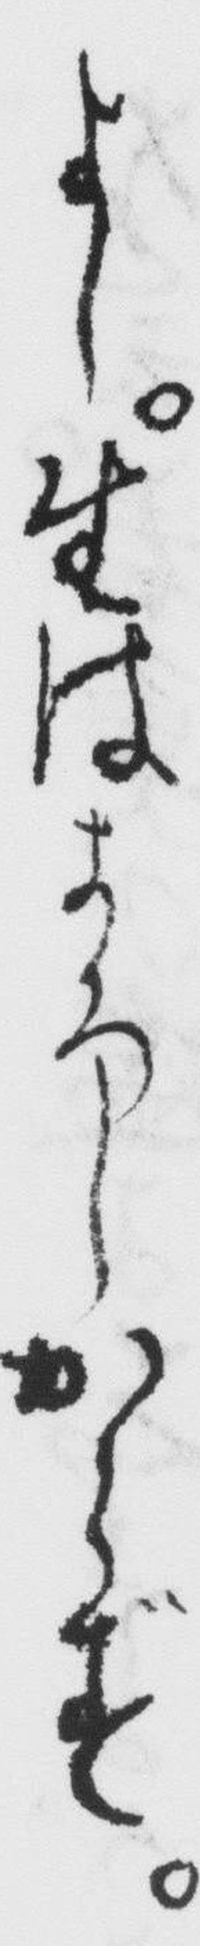よし。生はよろしからず。
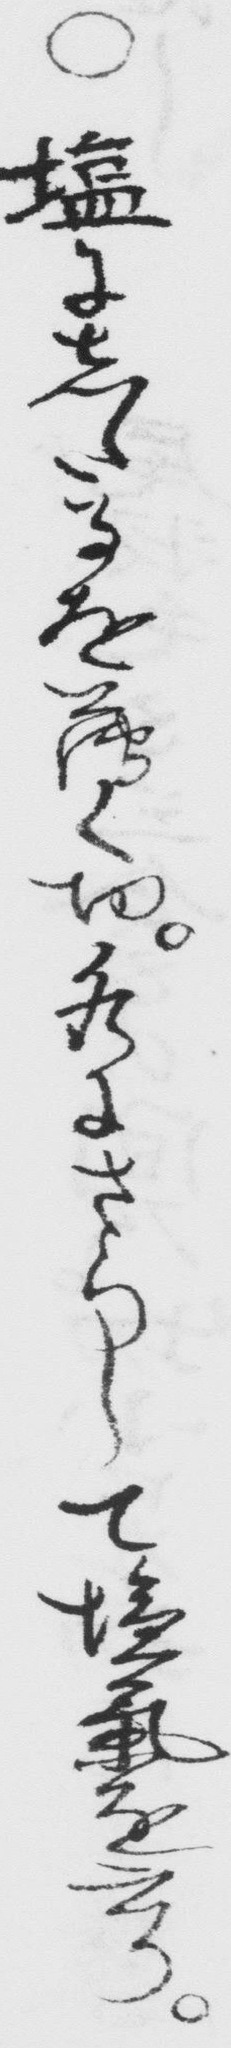○塩にしたるを薄く切。水にさらして塩気を去り。
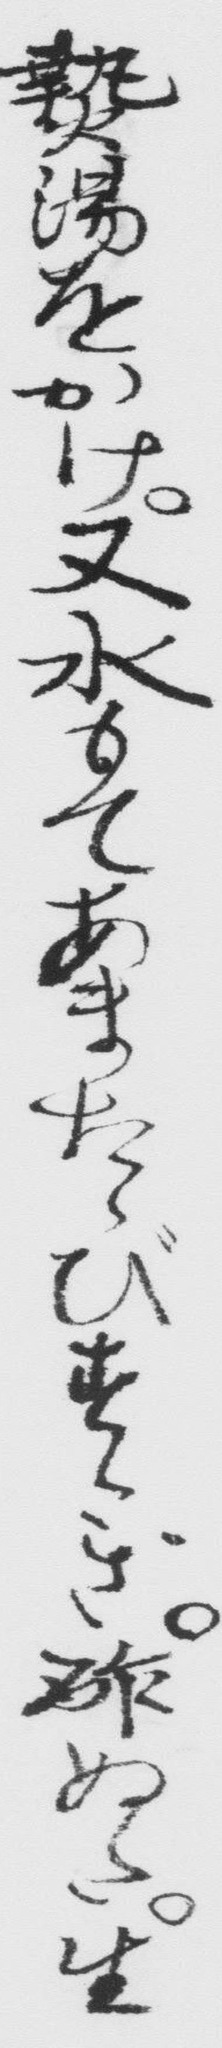熱湯をかけ。又水もてあまたゝびすゝぎ。酢ぬた。生
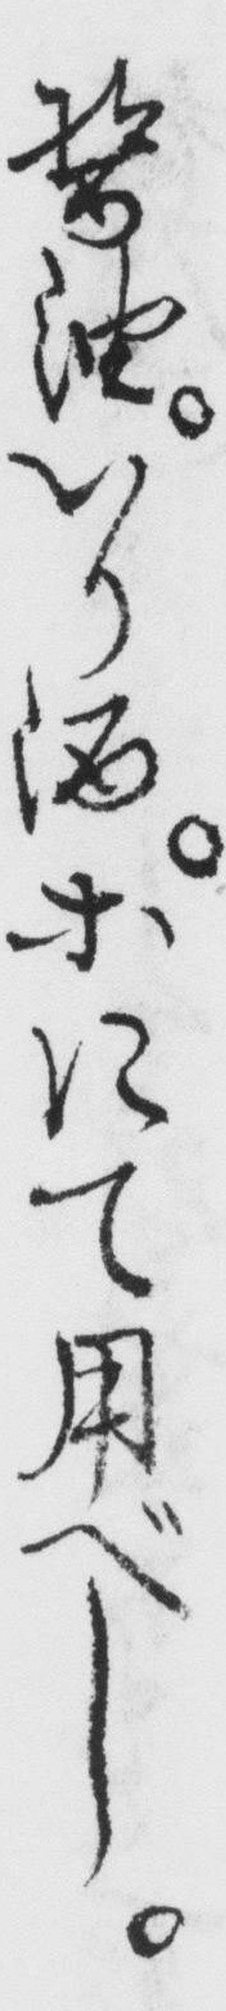醤油。いり酒。等にて用べし。

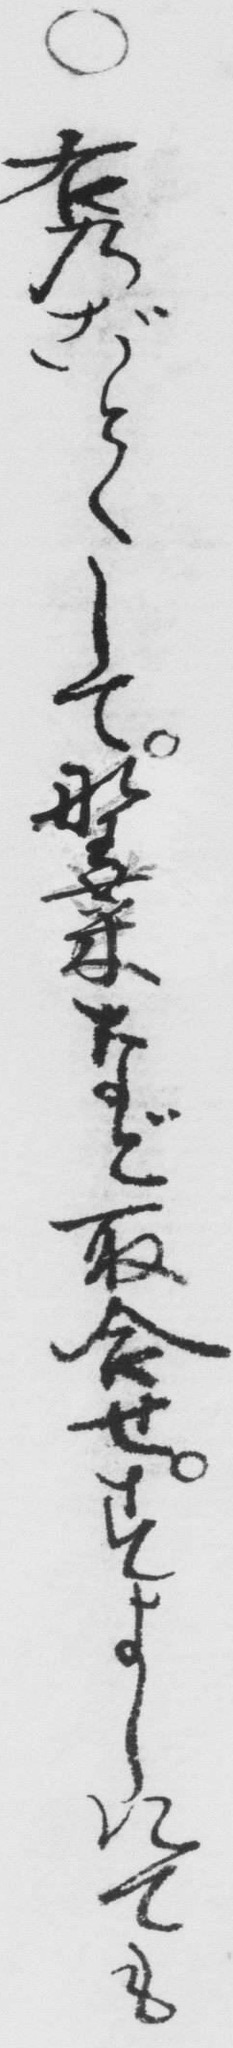○右のごとくして。野菜など取合せ。すましにても
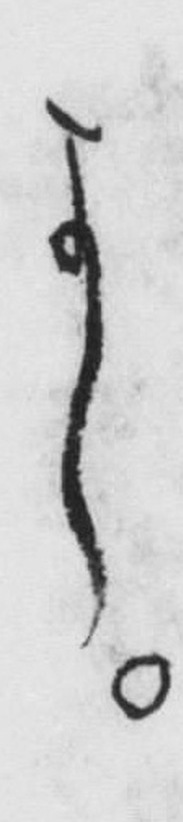よし。
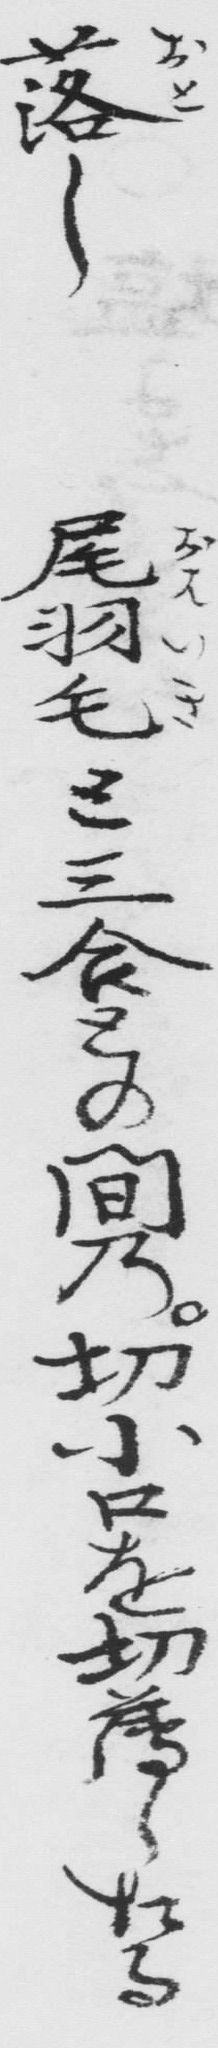落し尾羽毛と三合の間の。切小口を切薄したる
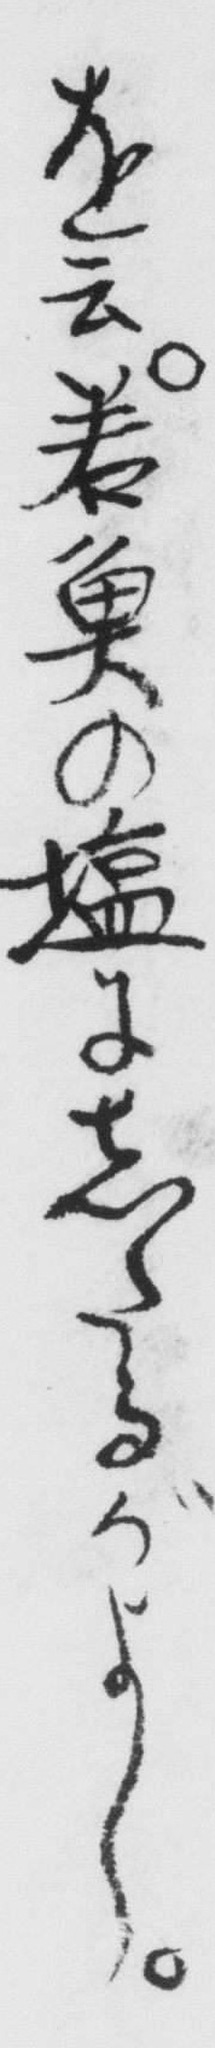を云。若魚の塩にしたるがよし。
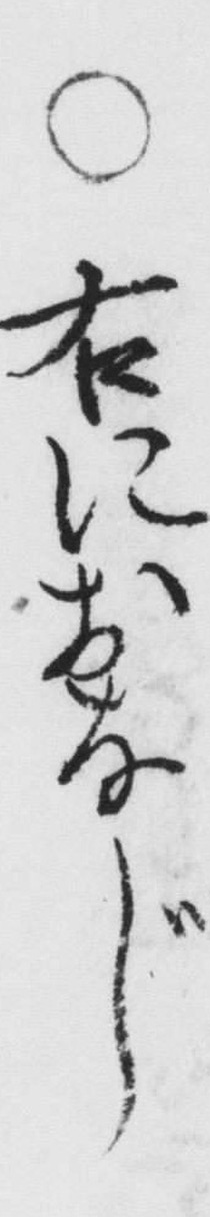○右におなじ
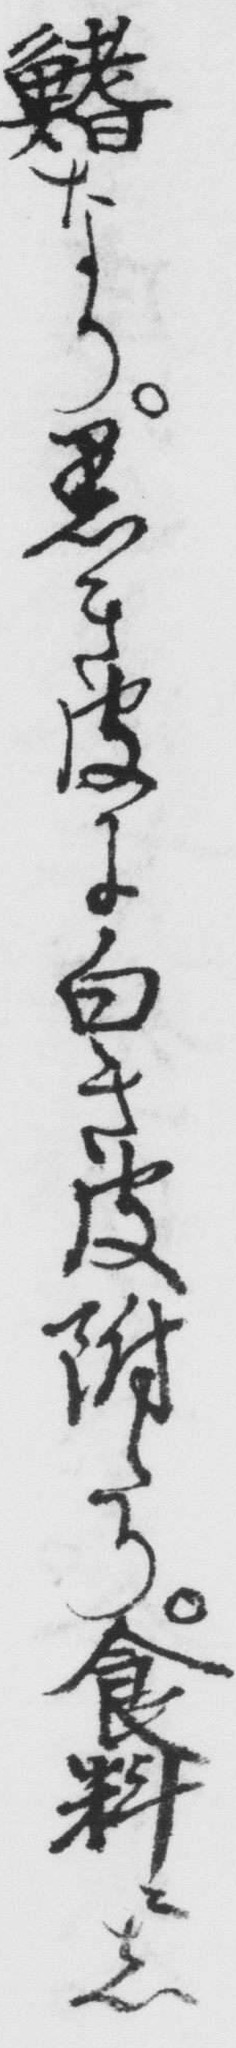立羽鰭なり。黒き皮に白き皮附たり。食料にし
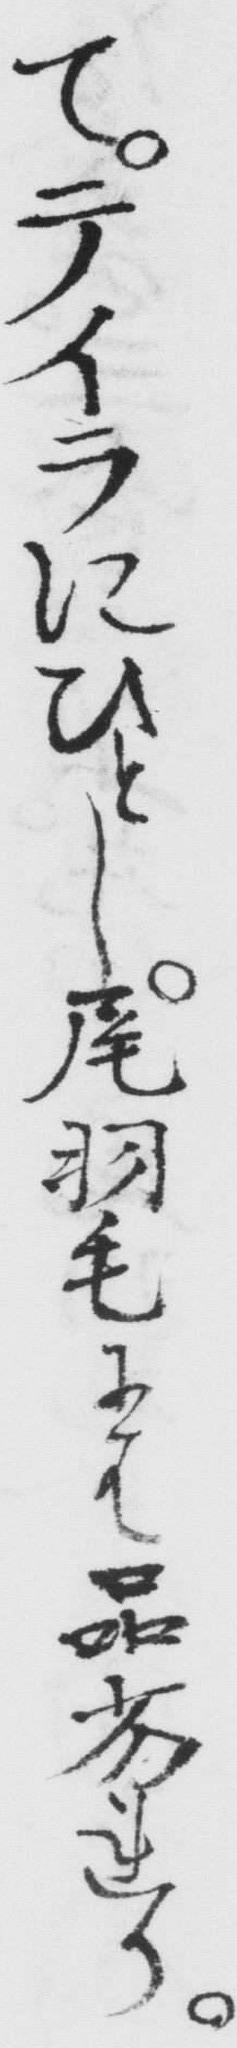て。テイラにひとし。尾羽毛には品劣れり。
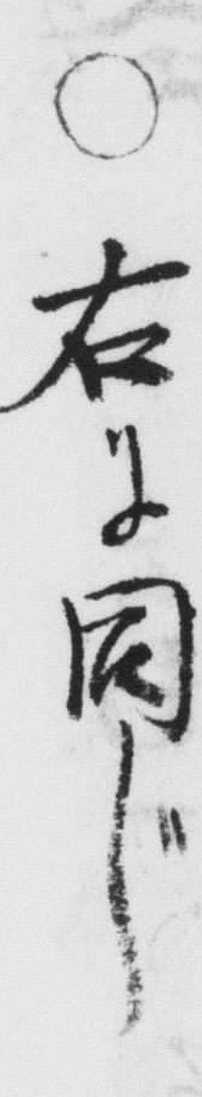○右に同じ
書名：鯨肉調味方
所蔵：大阪府立大学学術情報センター 国文学研究資料館
